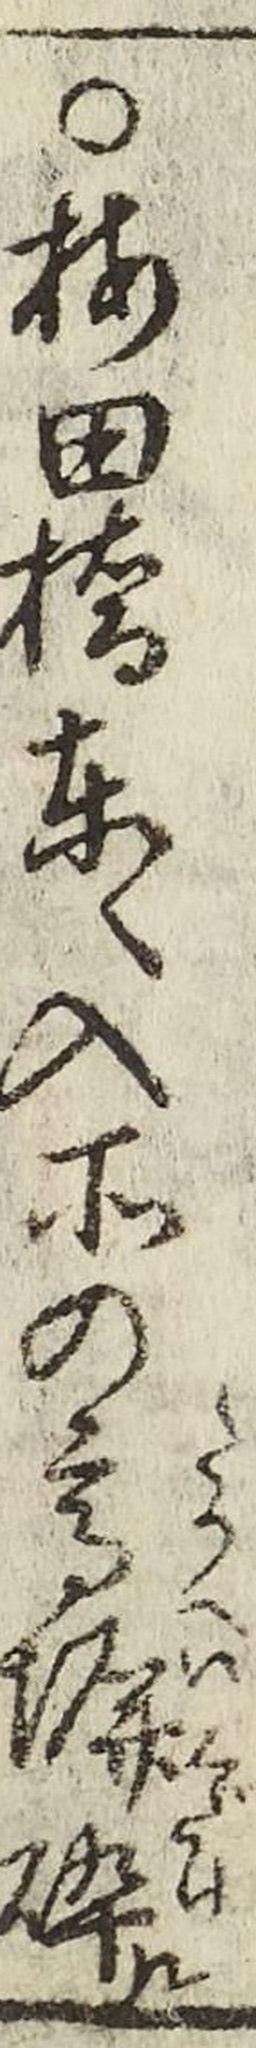〇梅田橋東へ入所の高塀砕ル

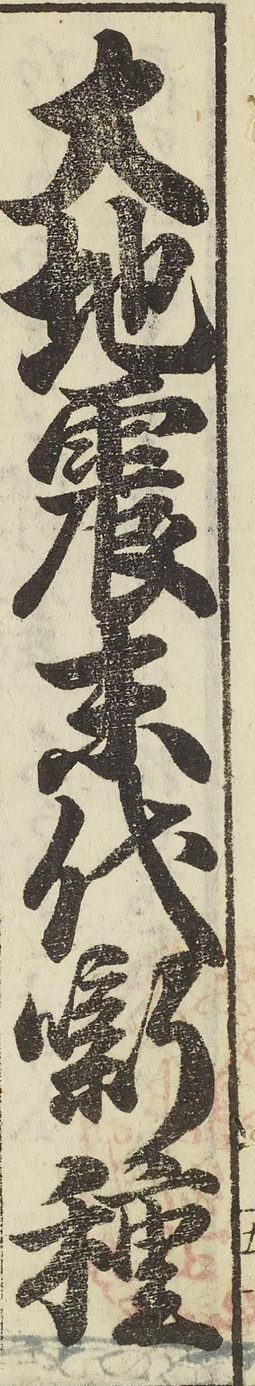大地震末代噺種
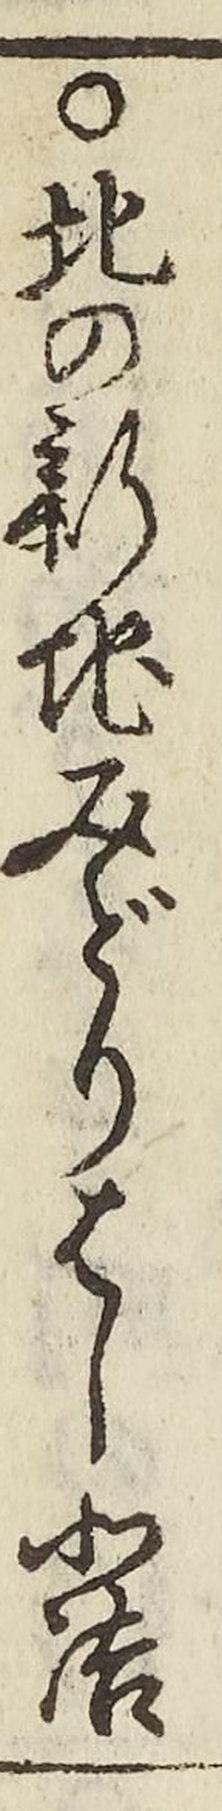○北の新地みどりはし北詰
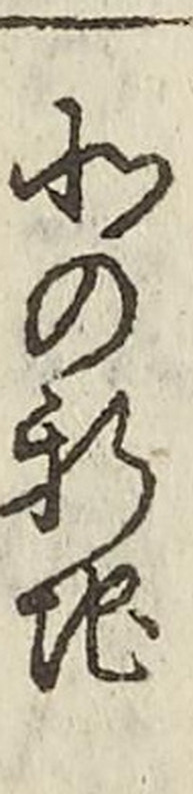北の新地
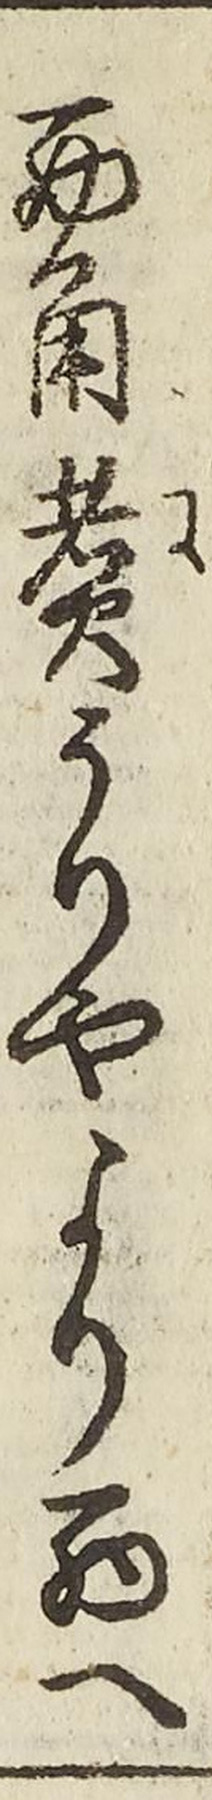西角煮うりやより西へ
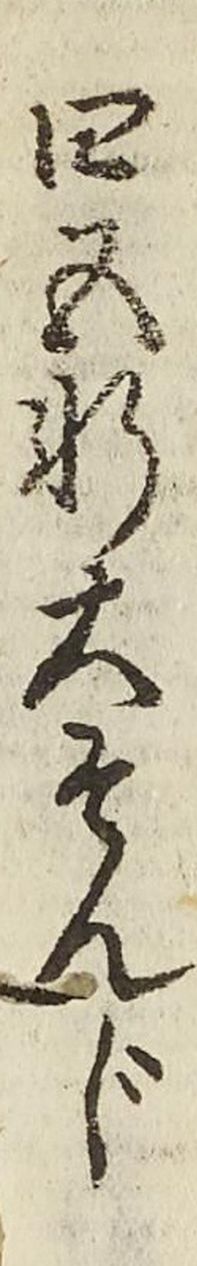四五軒大そんじ
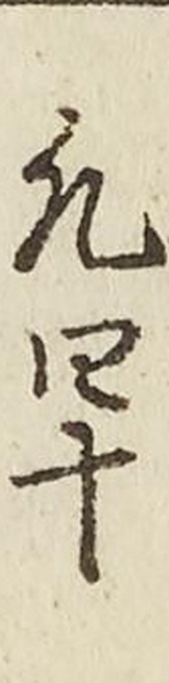凡四十
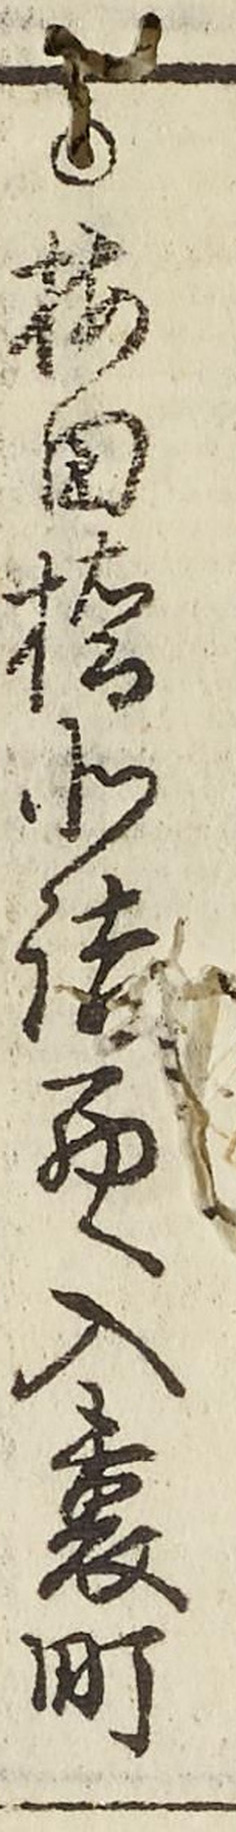○梅田橋北詰西へ入裏町
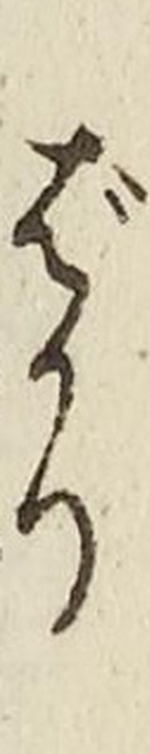ばかり
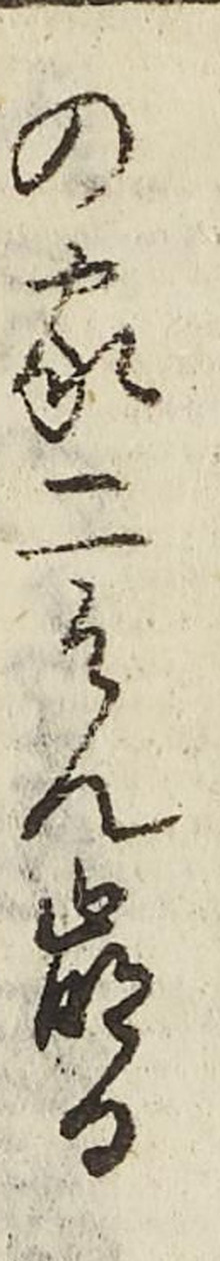の家二けん崩る
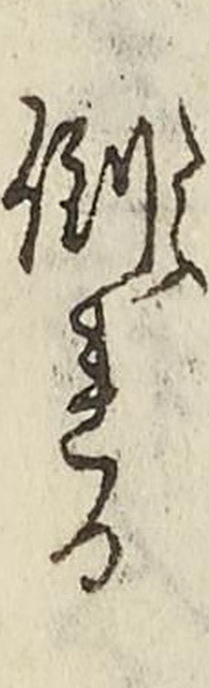倒れる
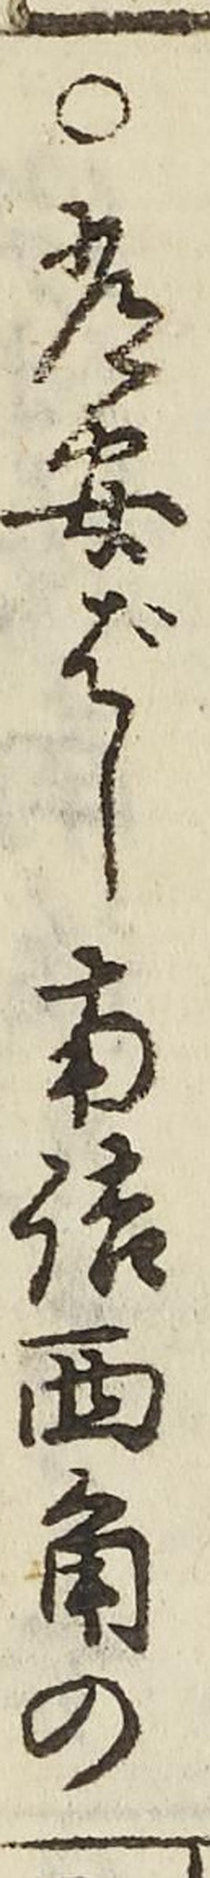○常安ばし南詰西角の
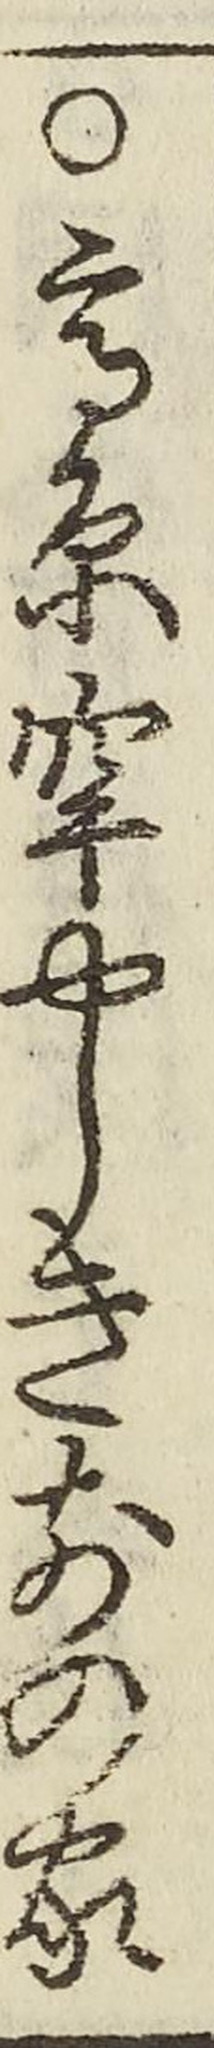○高原牢やしき前の家
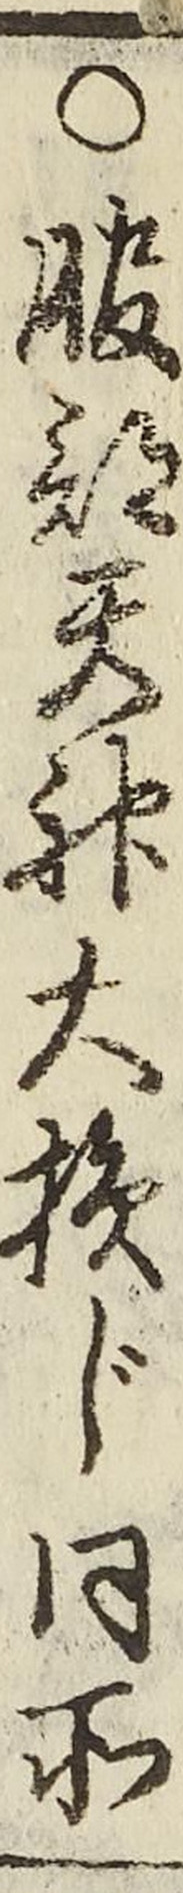○服部天神大損じ同所
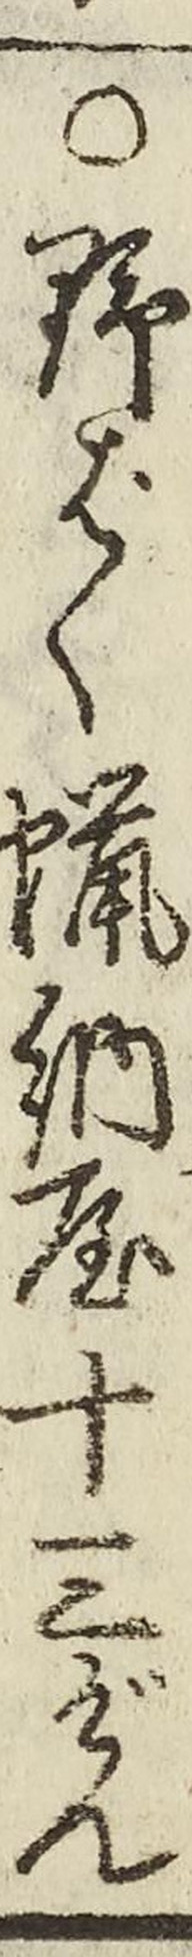○野はく蝋納屋十三げん
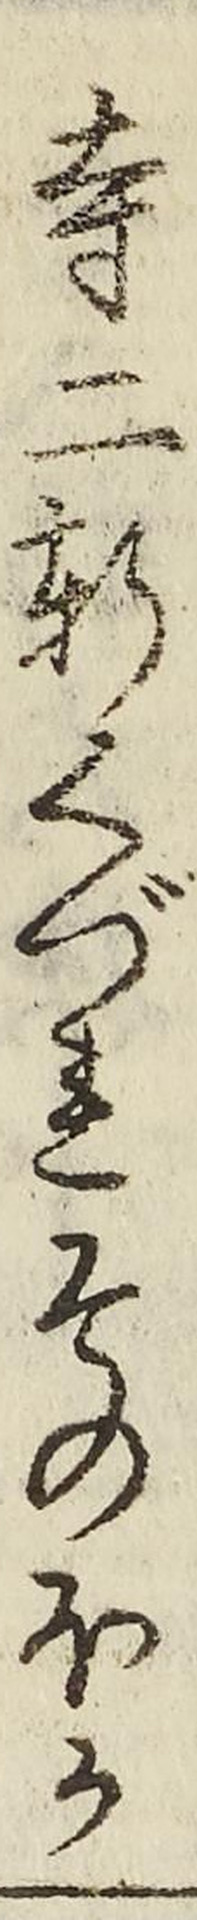寺二軒くづれそのほか
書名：地震津浪末代噺の種　全
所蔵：東京大学地震研究所図書室 Earthquake Research Institute Library, The University of Tokyo, JAPAN
